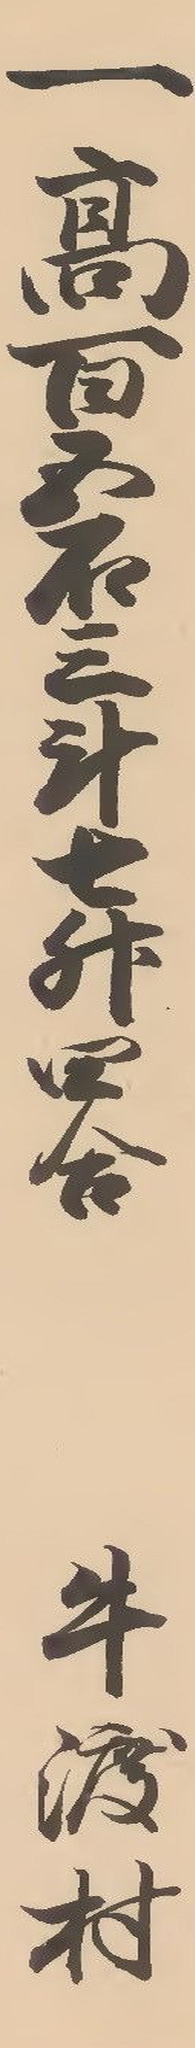一高百五石三斗七升四合牛渡村
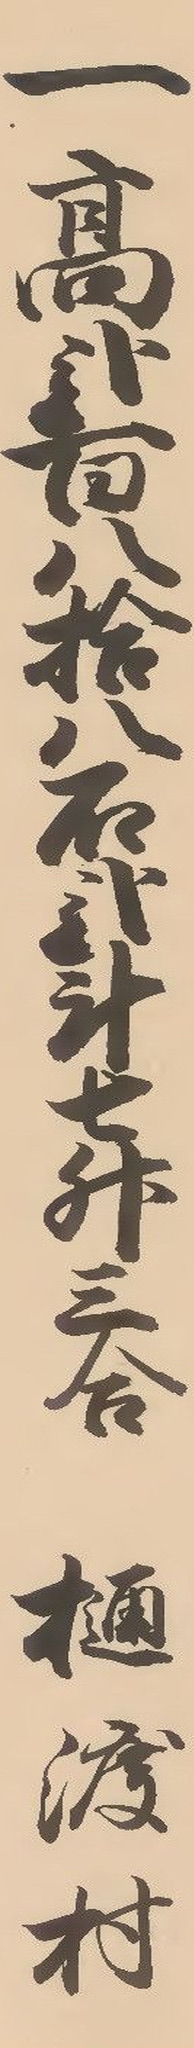一高弐百八拾八石弐斗七升三合樋渡村
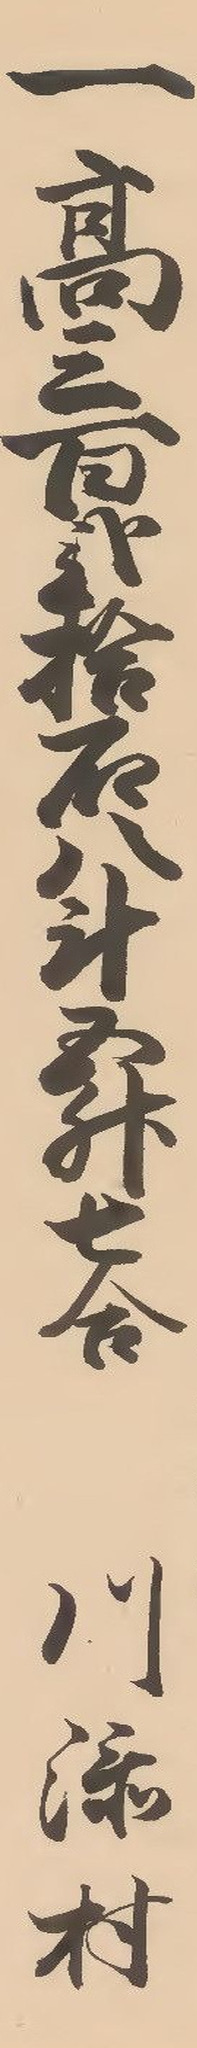一高三百弐拾石八斗五升七合川添村
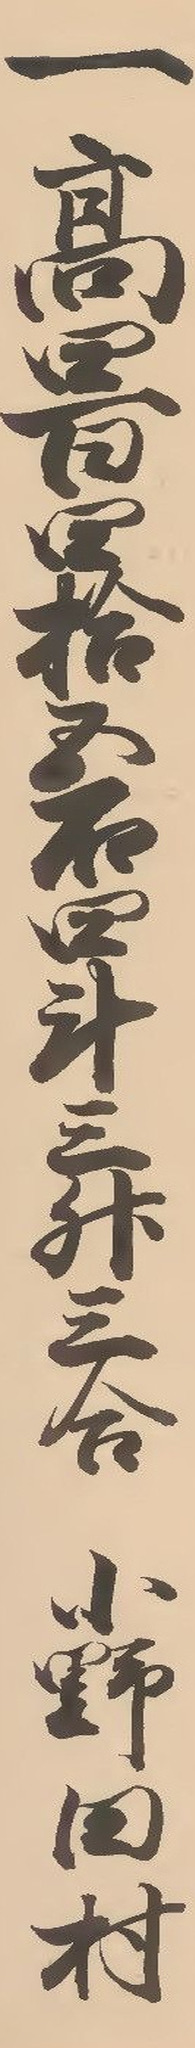一高四百四拾五石四斗三升三合小野田村
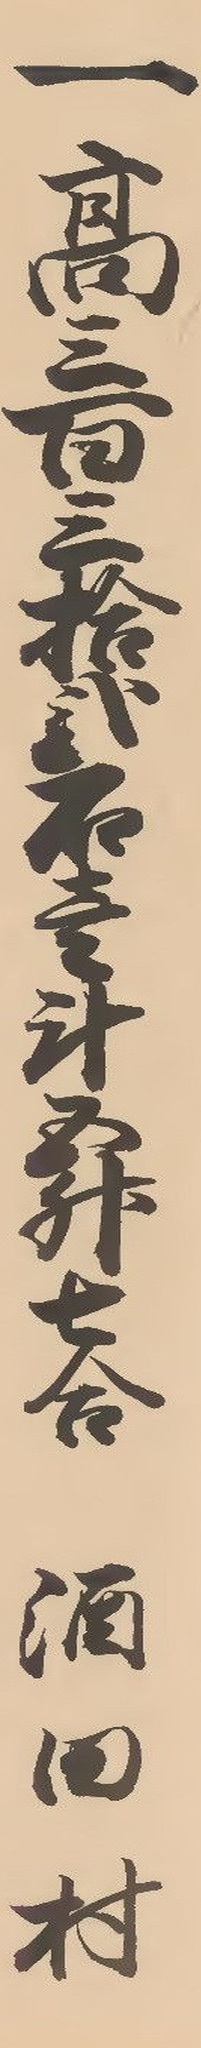一高三百三拾弐石壱斗五升七合酒田村
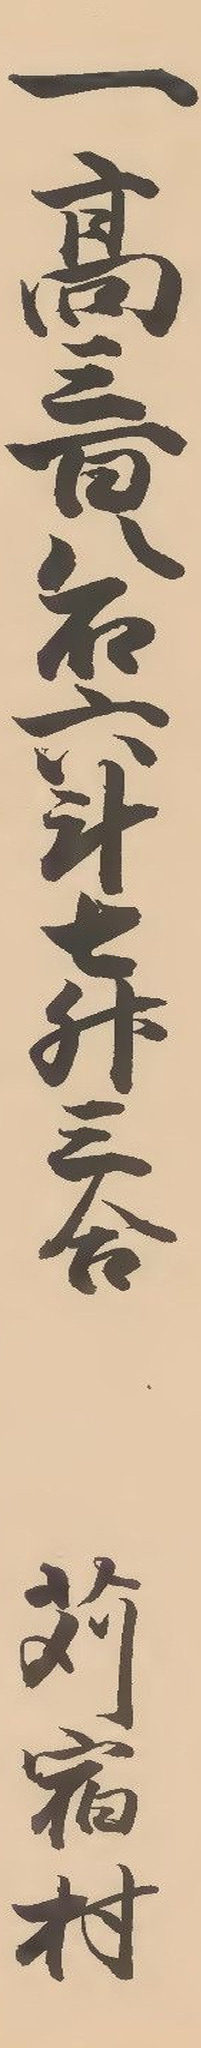一高三百八石六斗七升三合苅宿村
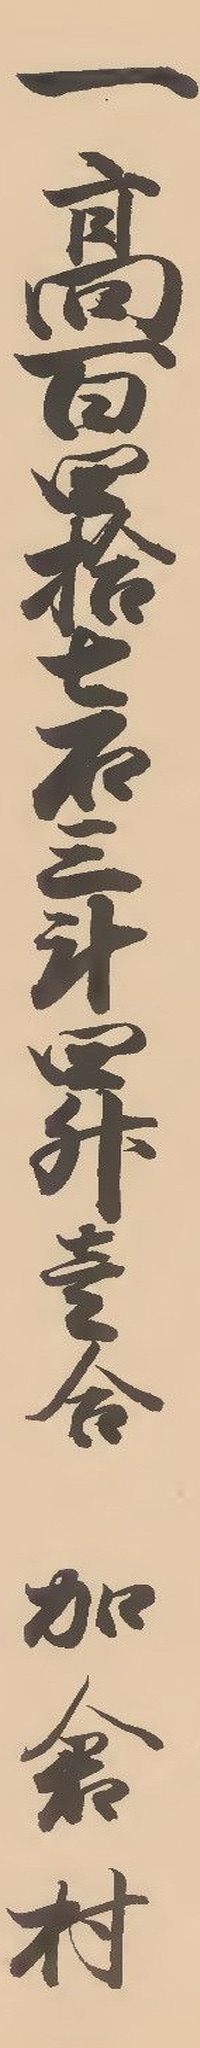一高百四拾七石三斗四升壱合加倉村
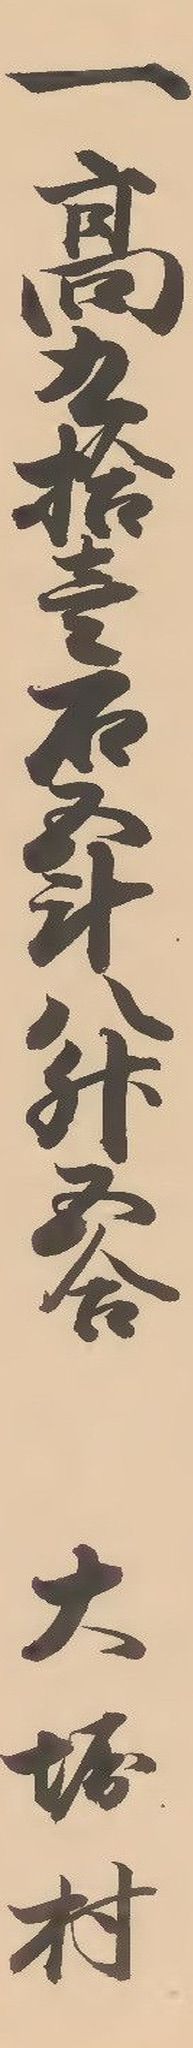一高九拾壱石五斗八升五合大堀村

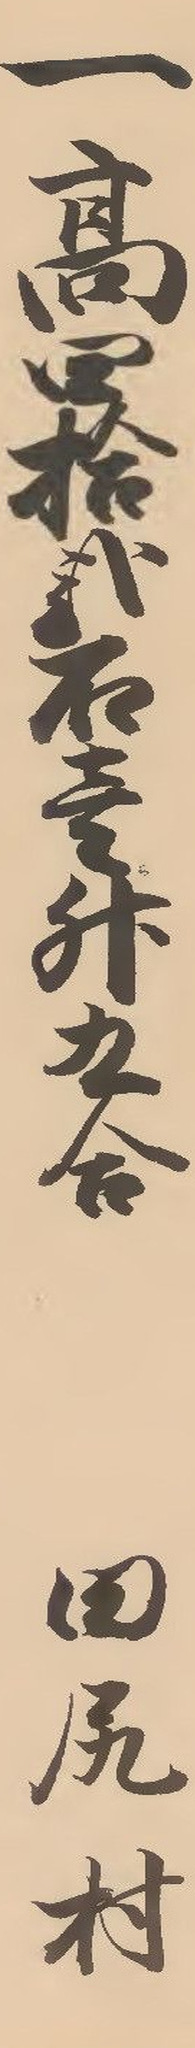一高四拾弐石壱升九合田尻村
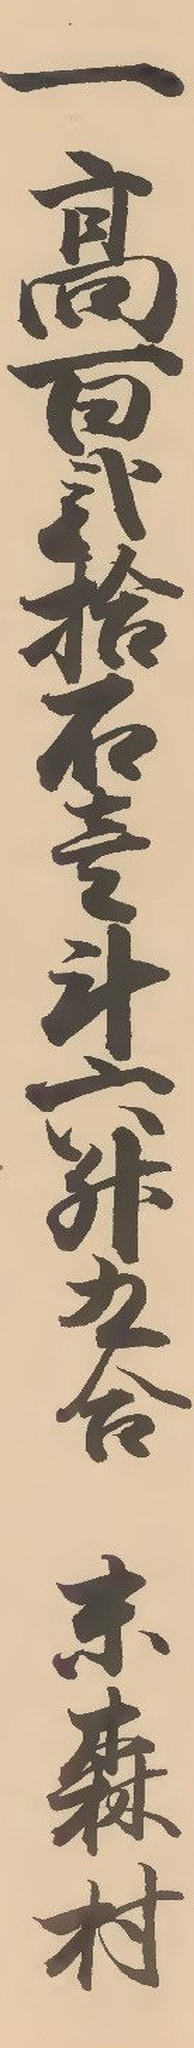一高百弐拾石壱斗六升九合末森村
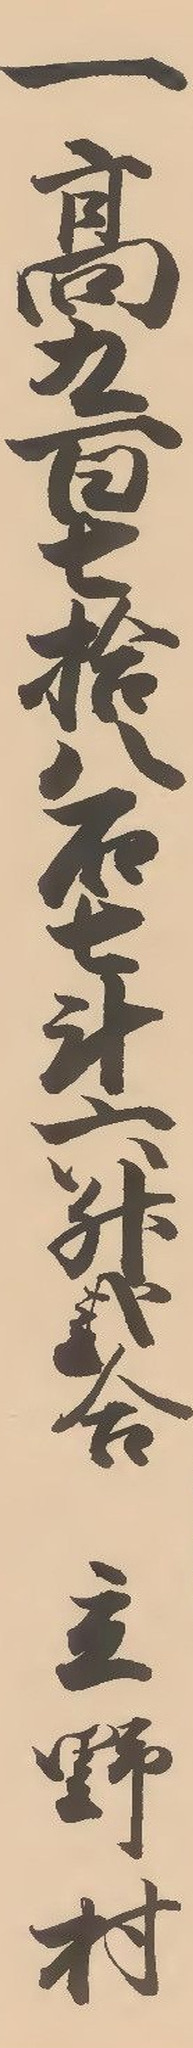一高九百七拾八石七斗六升弐合立野村
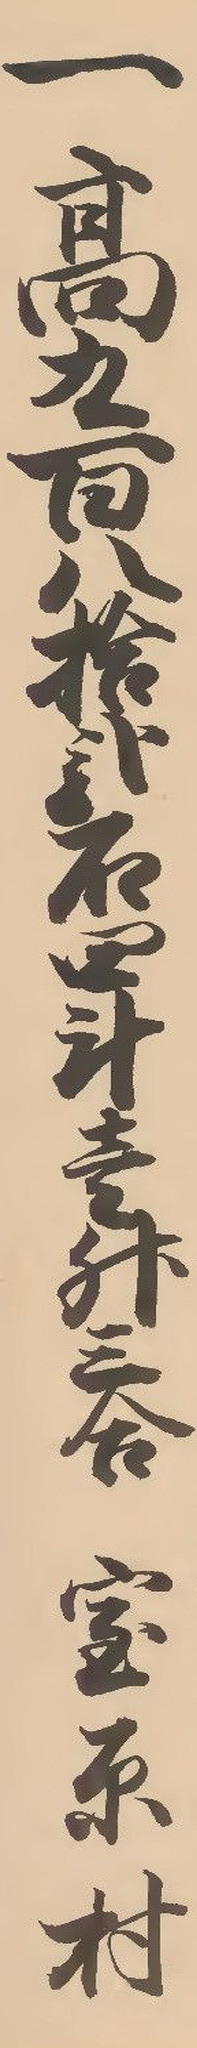一高九百八拾弐石四斗壱升三合室原村
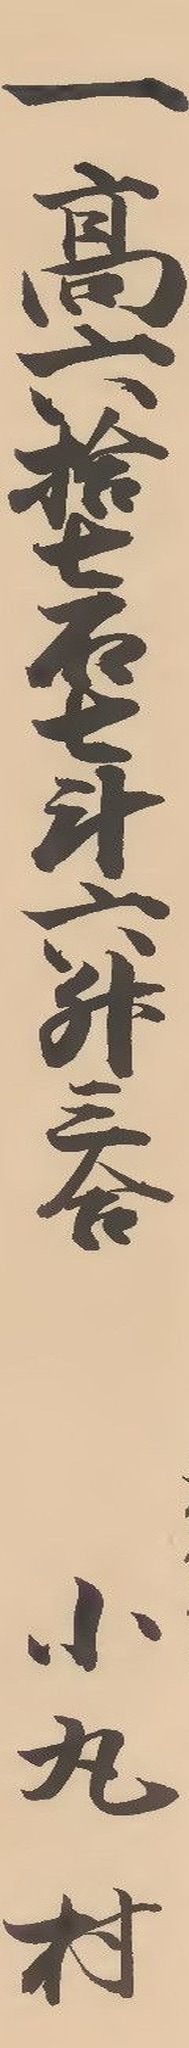一高六拾七石七斗六升三合小丸村
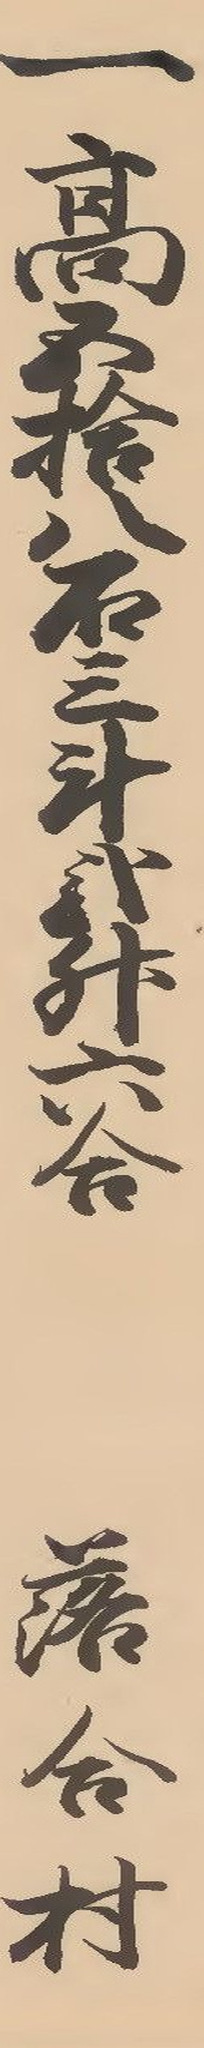一高五拾八石三斗弐升六合落合村
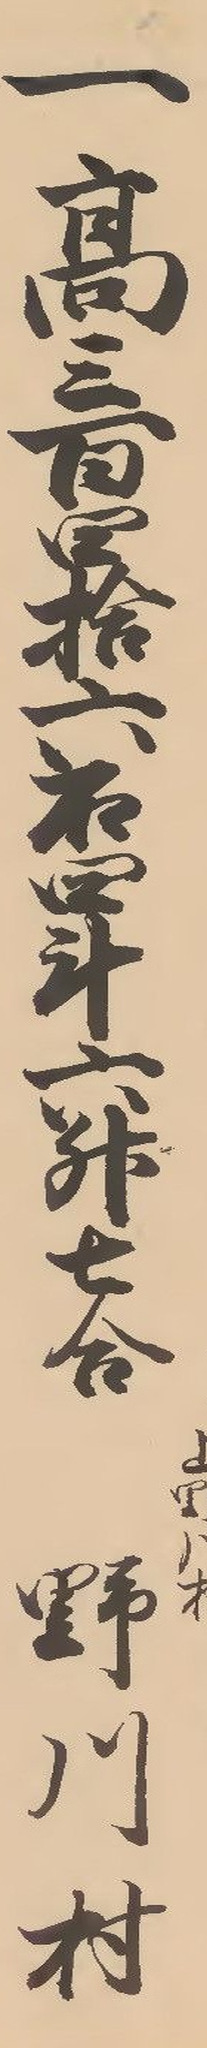一高三百四拾六石四斗六升七合野川村
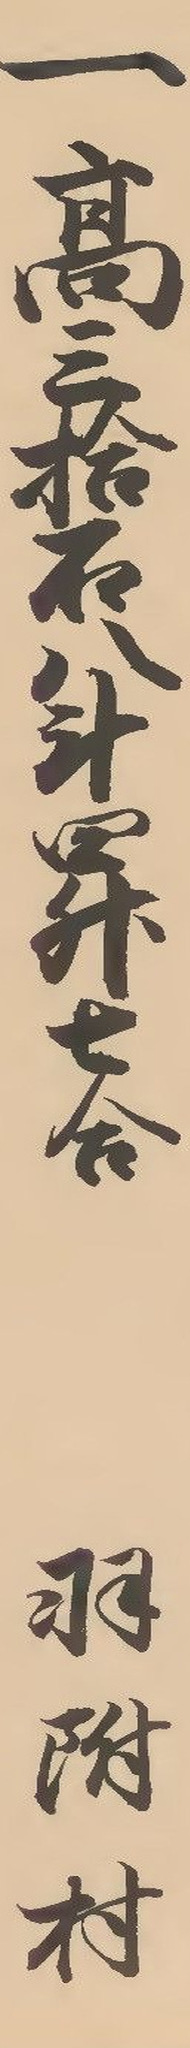一高三拾石八斗四升七合羽附村
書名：陸奥国郷帳　３
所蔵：国立公文書館 National Archives of Japan
